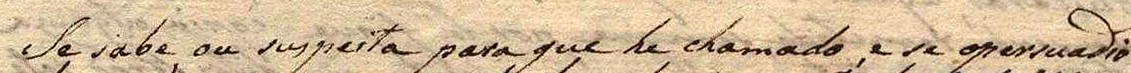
Se sabe ou suspeita para que he chamado, e se o persuadio
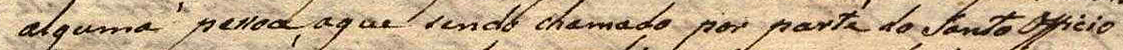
alguma pessoa, a que sendo chamado por parte do Santo Officio
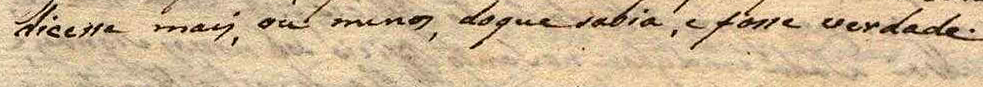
dicesse mais, ou menos, do que sabia, e fosse verdade.
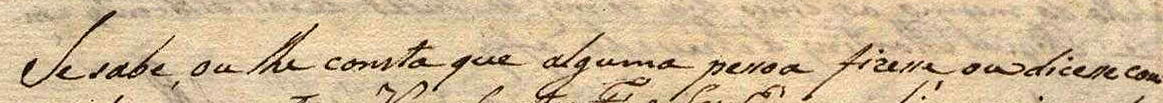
Se sabe, ou lhe consta que alguma pessoa fizesse, ou dicesse cou
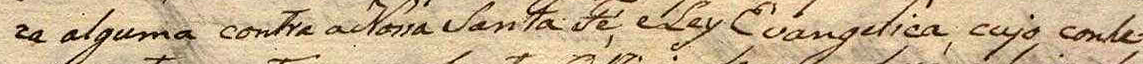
za alguma contra a Nossa Santa Fé, e Ley Evangelica, cujo conhe
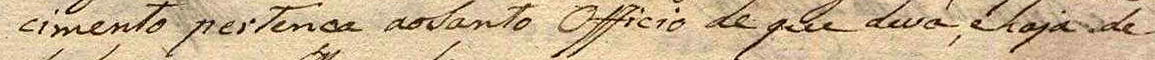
cimento pertença ao Santo Officio de que deva, e haja de
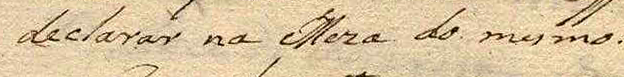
declarar na Meza do mesmo.
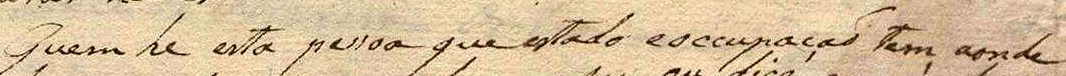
Quem he esta pessoa que estado e occupaçaõ tem, aonde
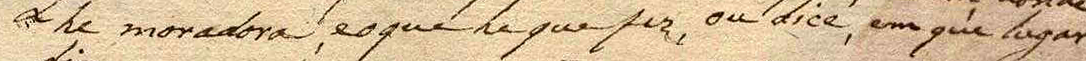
he moradora, e o que he que fez, ou dice, em que lugar
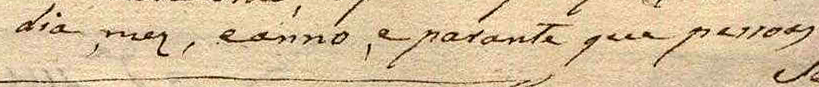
dia, mez, e anno, e parante que pessoas
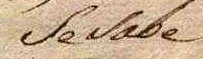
Se sabe
